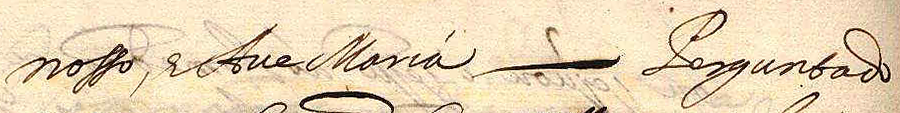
nosso, E Aue Maria _ Perguntado
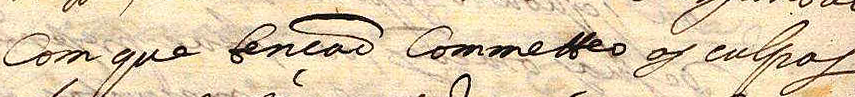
com que tenção commetteo as culpas
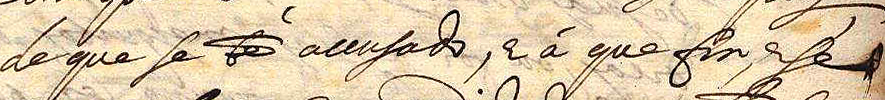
de que se tē accusado, E a que fim, E se
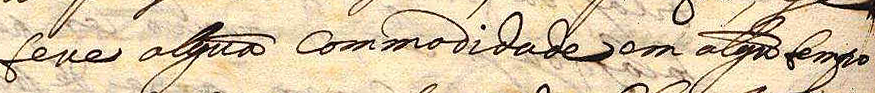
teue alguā commodidade em algū tempo
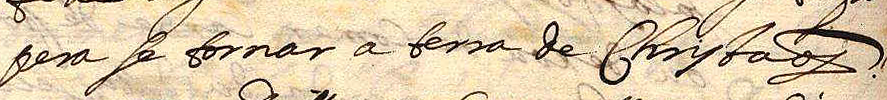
pera se tornar a terra de Christaõs,
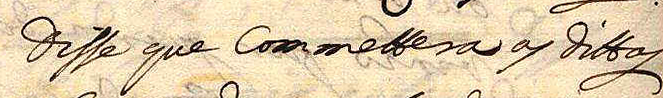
Disse que commettera as dittas
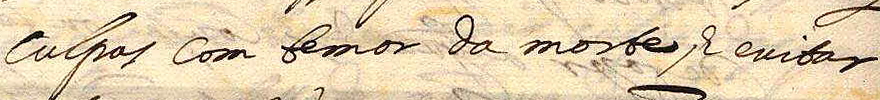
culpas com temor da morte, E euitar
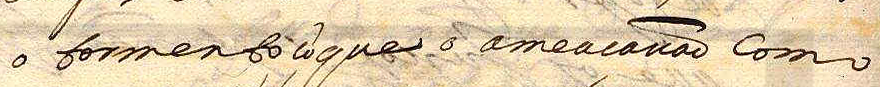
o tormento cō que o ameaçauão como
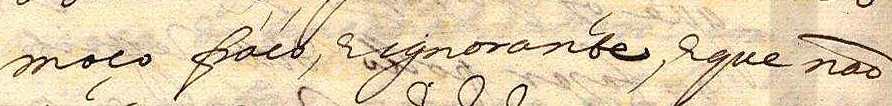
moço fraco, E ignorante, E que naõ
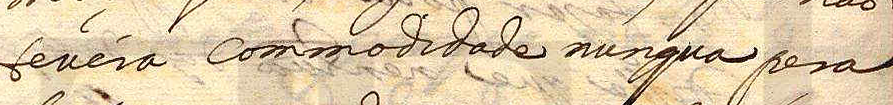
teuera commodidade nunqua pera
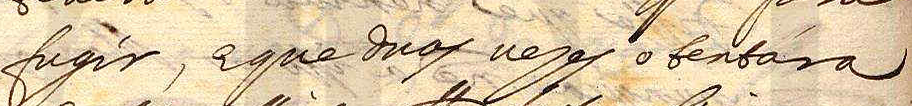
fugir, E que duas uezes o tentara
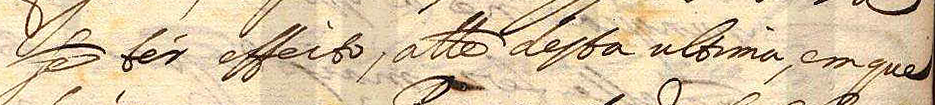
sē ter effeito, atte desta ultima em que
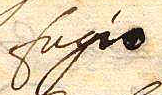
fugio
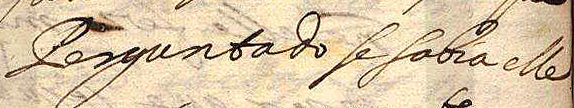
Perguntado se sabia elle
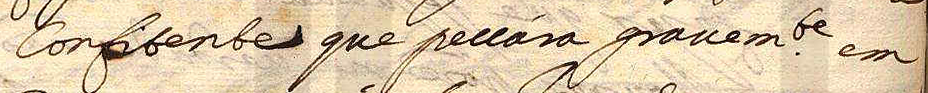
Confitente que peccara grauemte em
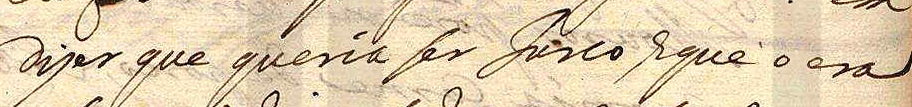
dizer que queria ser turco, E que o era
